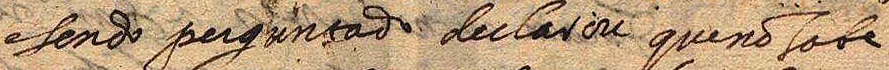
e sendo perguntado declarou que nō sabe
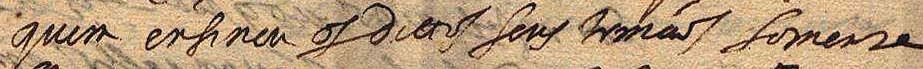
quem ensinou os dittos seus Irmaõs somente
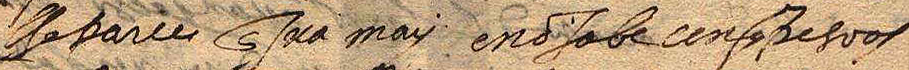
lhe parece q̄ sua may e nō sabe em q̄ pesoas
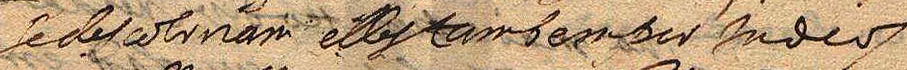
se descobriram elles tambem per Iudeos
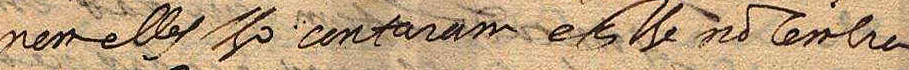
nem eles lho contaram e q̄ lhe nō lembra
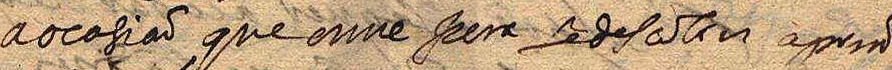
a ocasiaõ que ouue pera se descobrir a primra
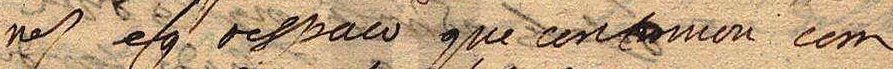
uez e q̄ o espaco que continuou com
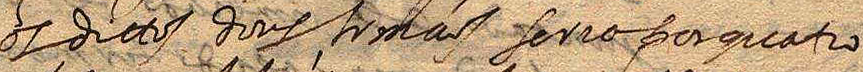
os dittos dous Irmaõs seria per quatro
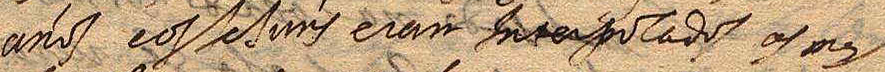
an̄os e aos IeIuns eram Interpolados os mes
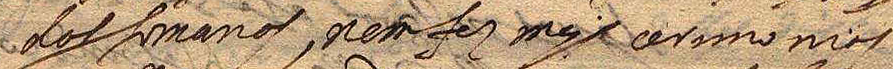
dos somanas nem fez majs cerimonias
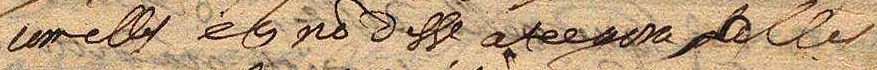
com elles e q̄ nō disse ateegora delle
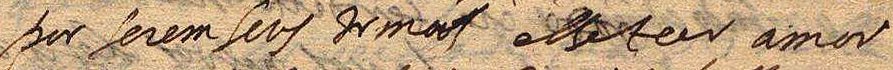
por serem seus Irmaõs e lhe tem amor
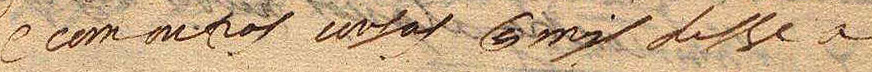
e com outras cousas q̄ majs disse a
